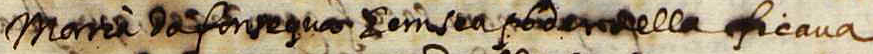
Maria da fonsequa E em seu poder della ficaua
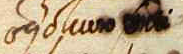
o q̄ o liuro Conti
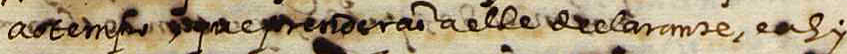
ao tempo que prenderaõ a elle declarante, e ahy
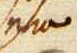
nha
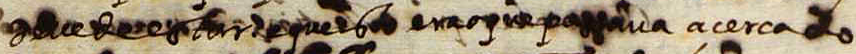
deue de estar e que isto era o que passaua acerca do
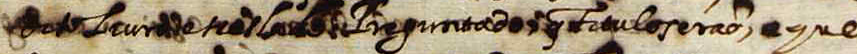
dito Liuro e treslado. Preguntado q̄ titulos eraõ, e que
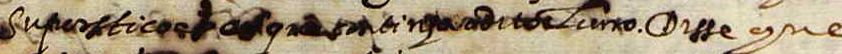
superstiçoes as que continha o dito Liruo. Disse que
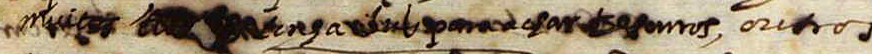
muitos tito_os tinha ribus para achar thesouros, outros
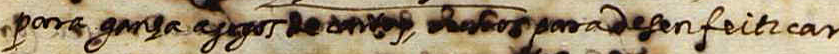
para ganha a jogos de cartas, outros para desenfeitiçar
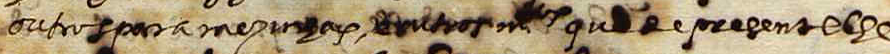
outros para mezinhas, e outros mtos que de presente lhe
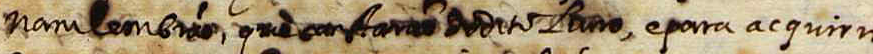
nam lembrão, que constaraõ do dito Liuro, e para acquirir
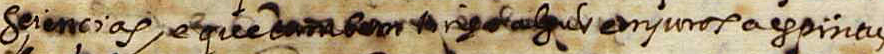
Sciencias, e que tambem tinha algūs conjuros a espiritus
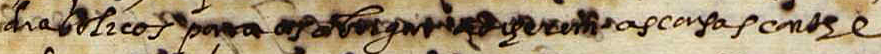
diabolicos para os obrigar dizerem as cousas conthe
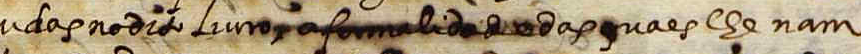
udas no dito Liuro, a formalidade das quaes lhe nam
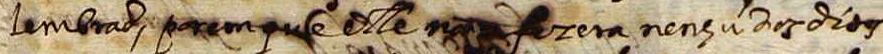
lembraõ, porem que elle naõ fezera nenhū dos ditos
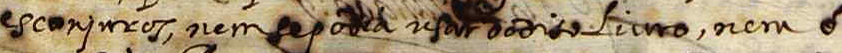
esconjuros, nem se podia usar do dito Liuro, nem o
